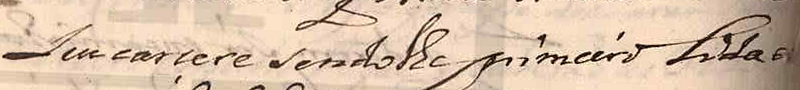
seu carcere sendolhe primeiro lida e
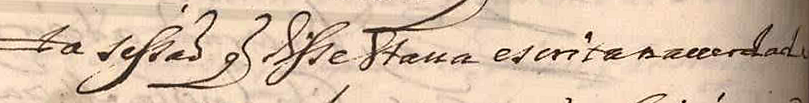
ta sessaõ q̄ disse estaua escrita na uerdade
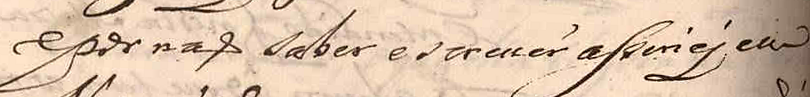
e por naõ saber escreuer assinej eu
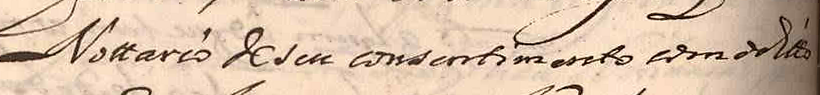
Nottario de seu consentimento com o ditto
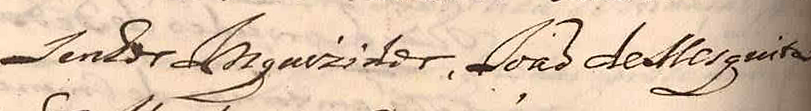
Senhor Inquizidor, Ioão de Mesquita
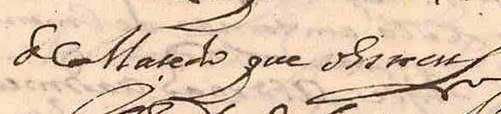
de Macedo que o Escreuj
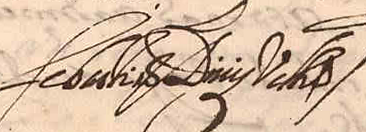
Sebastiaõ Diniz Velho
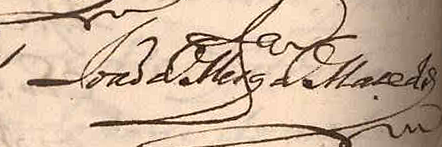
Ioaõ de Mesqta de Macedo
